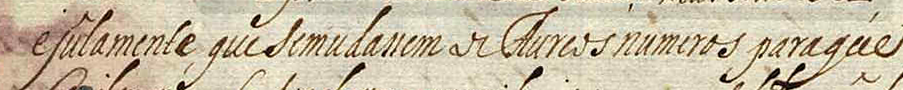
e jūtamente, que semudassem os Aureos numeros para que
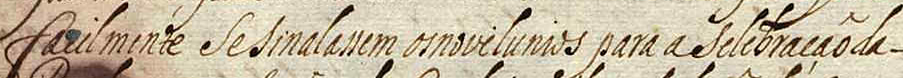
facilmente se sinalassem os novilunios para a Selebraçaõ da
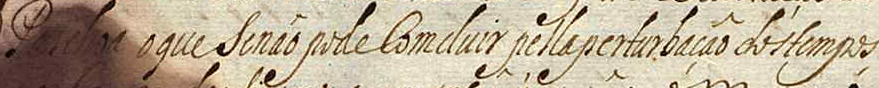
Paschoa, o que Se naõ pode Comcluir pella perturbação dos tempos
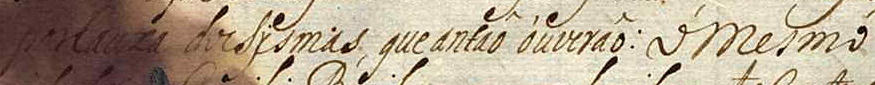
por Cauza doz Sysmas, que antaõ óuveraõ: o mesmo
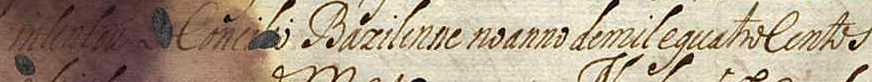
intentou _ Concilio Bazilensse no anno de mil e quatroCentos
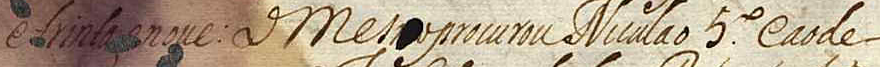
e trinta e noue: O Mes_o procurou Niculao 5.o e ao de
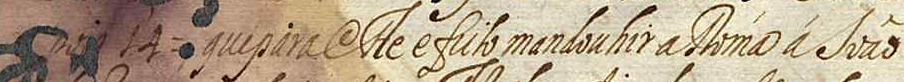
pois 14 = que para este efeito mandou hir a Roma á Ioaõ
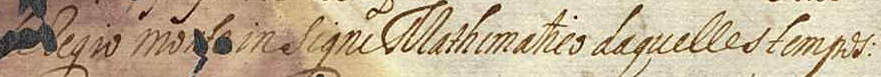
Regio mo_t_ insigne Mathematico daquelles tempos:
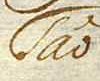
Taõ
